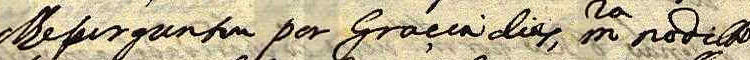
e lhe perguntou por Graçia dias, mra no ditto
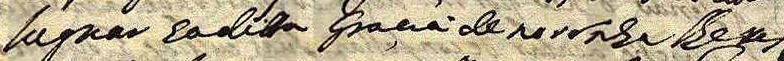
luguar E a ditta Graçia de noronha lhe res
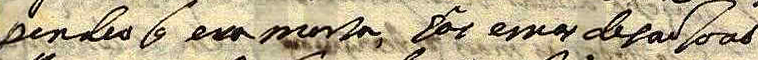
pondeo q̄ era morta, E âs eruas de saõ Joaõ
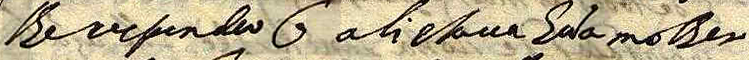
lhe respondeo q̄ ali estaua huā molher
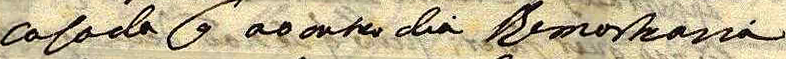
casada q̄ ao outro dia lhe mostraria
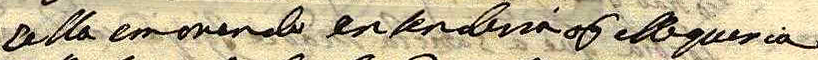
E ella em o uendo entenderia o q̄ elle queria
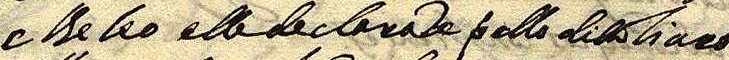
E lhe leo elle declarāte pello ditto liuro
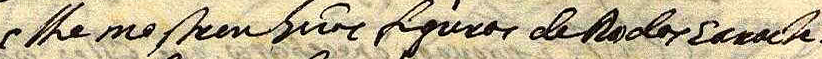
E lhe mostrou huās figuras de Rodas E aracte
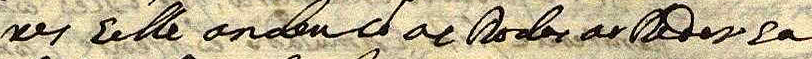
res E elle andou cō as Rodas ao Redor E a
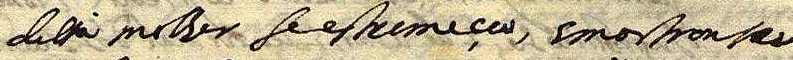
ditta molher se estremeçeo, E mostrou seo
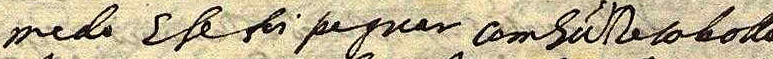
medo E se foi peguar com hū Retabollo
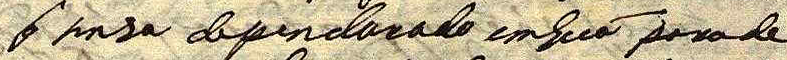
q̄ tinha dependurado em huā parade
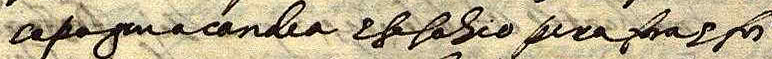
E apagou a candea E se sahio pera fora E foi
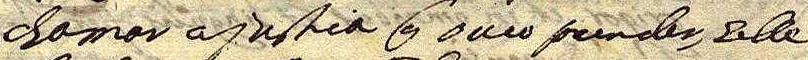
chamar a justica q̄ o ueo prender, E elle
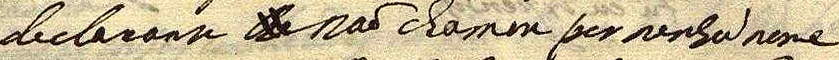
declarante lhe naõ chamou per nenhū nome
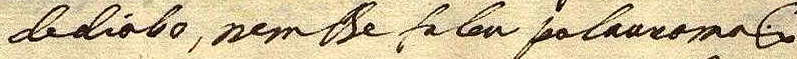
de diabo, nem lhe falou palaura mais
